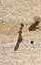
1.o
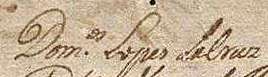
Dom.o Lopes da Cruz
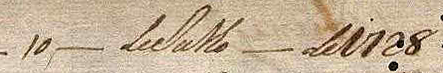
10 - de Iulho - de 1728
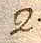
2.
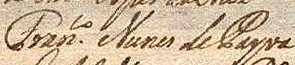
Fran.co Nunes de Payva
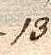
13
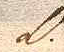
d.o
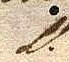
d.o
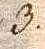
3.
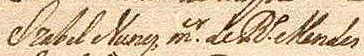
Izabel Nunes m.er de R.o Mendes
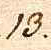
13.
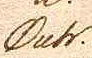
Outr.o
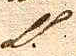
d.o
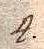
4.
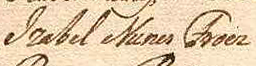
Izabel Nunes Froez
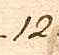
12.
